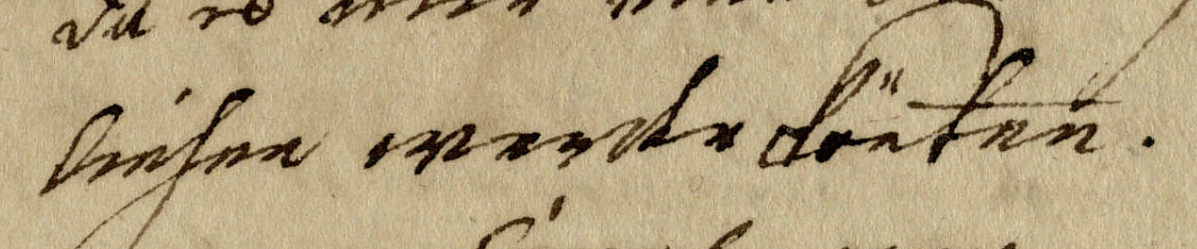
liehen werden könten.
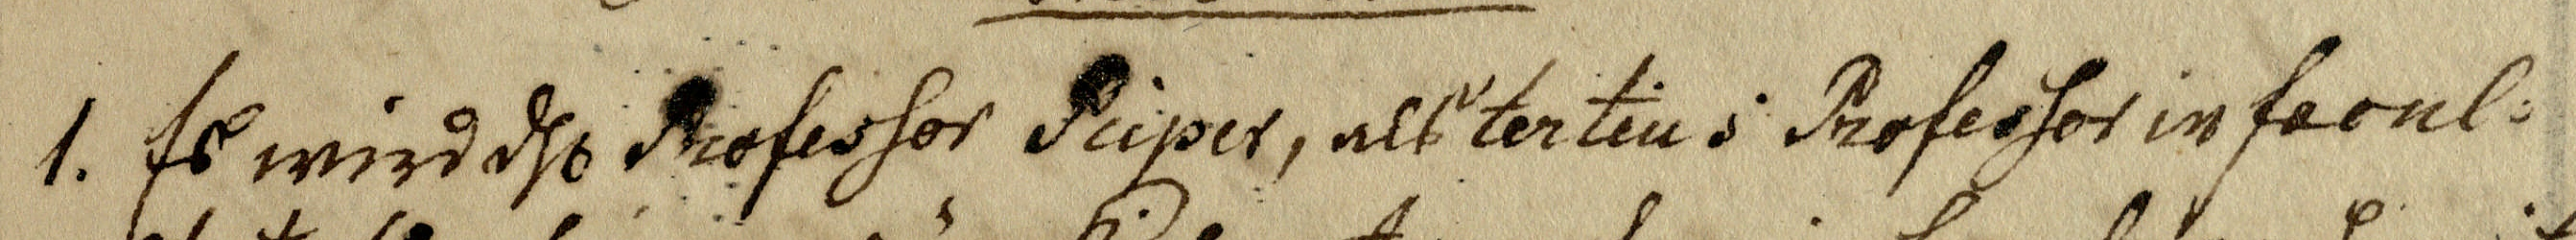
1. Es wird dh Professor Pieper, als tertius Professor in facul¬
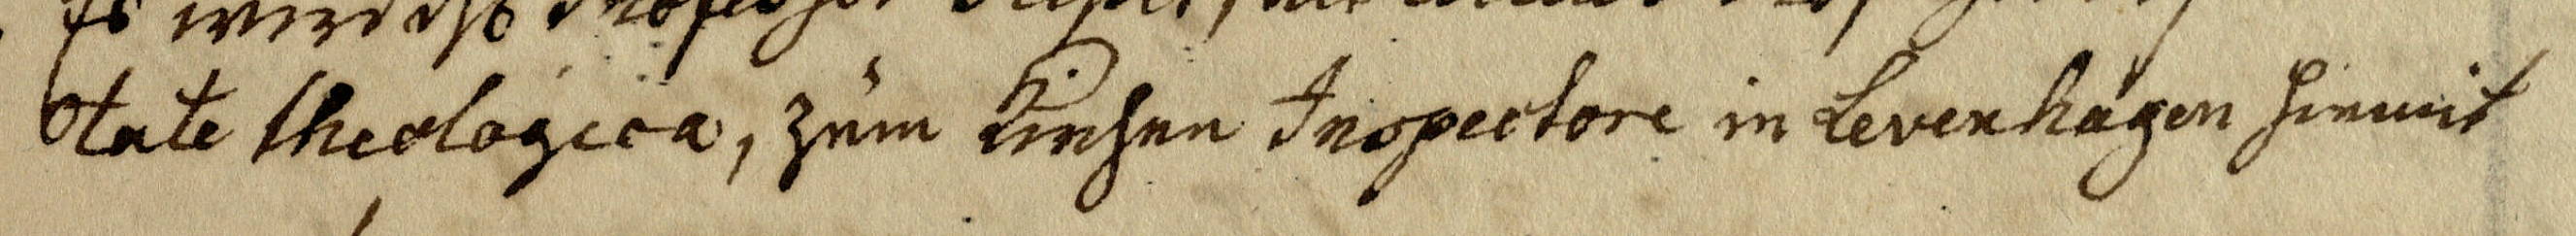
tate theologica, zum Kirchen Inspectore in Levenhagen hiemit
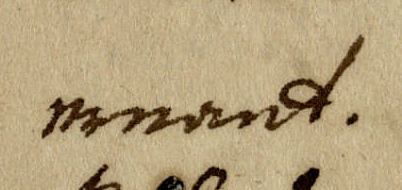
ernant.
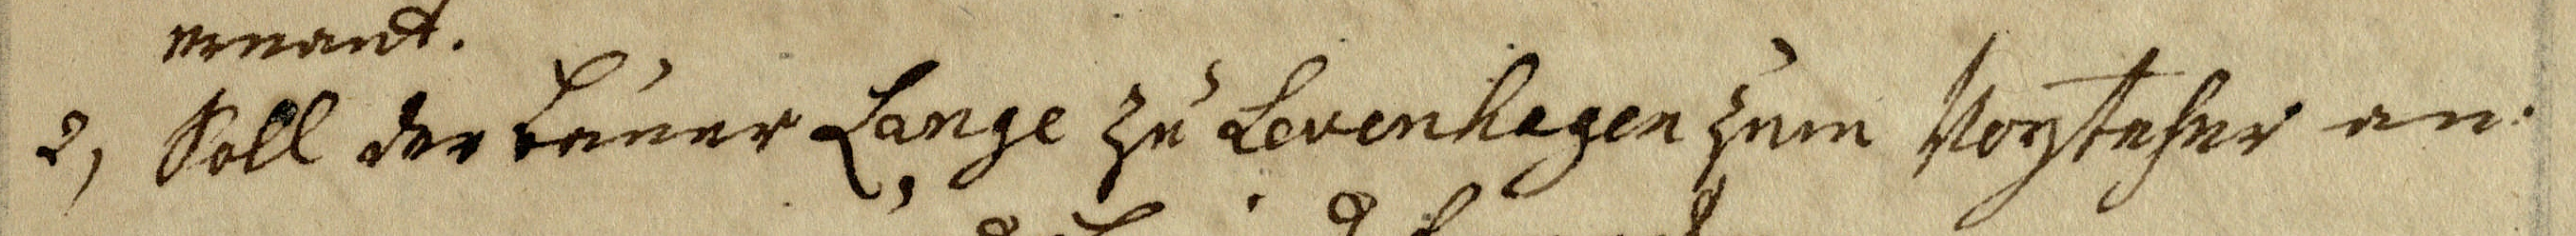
2, Soll der Bauer Lange zu Levenhagen zum Vorsteher an¬
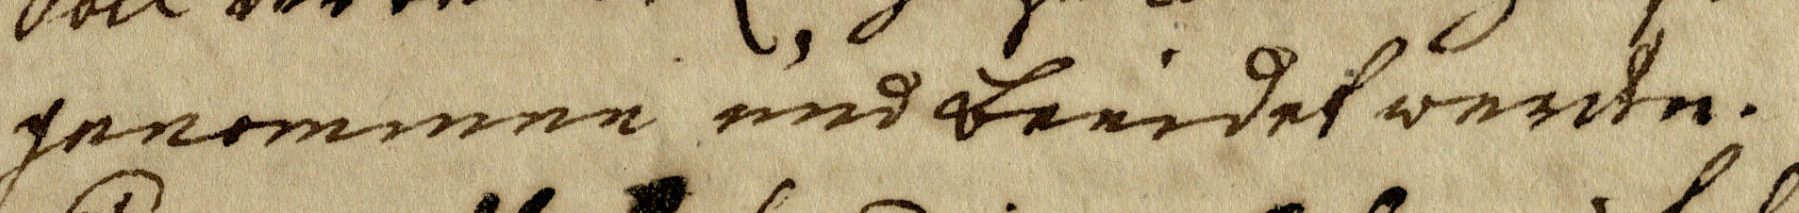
genommen und beeidet werden.
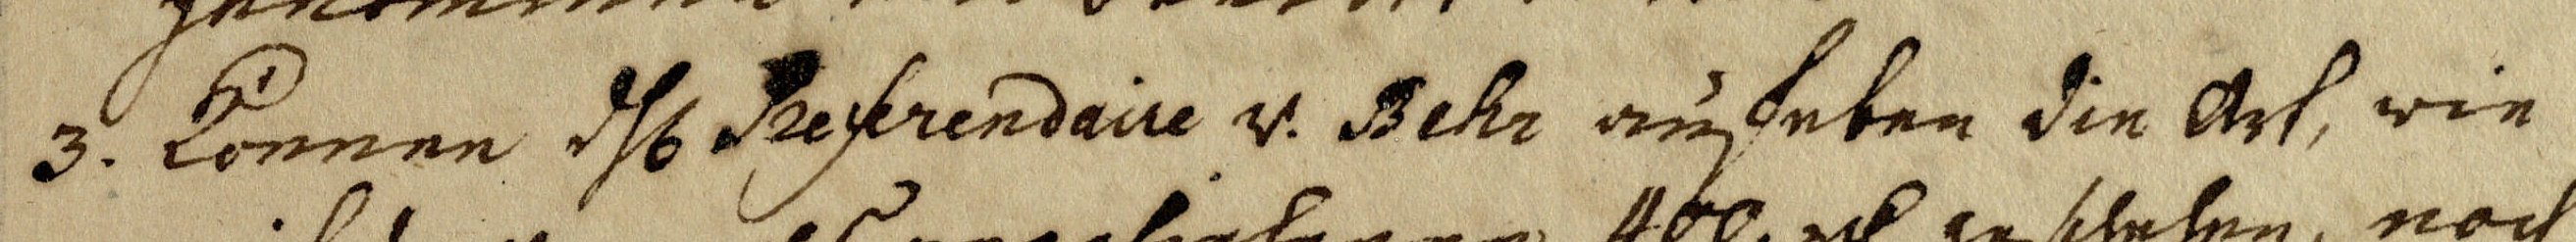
3. Können dh Referendaire v. Behr auf eben die Art, wie
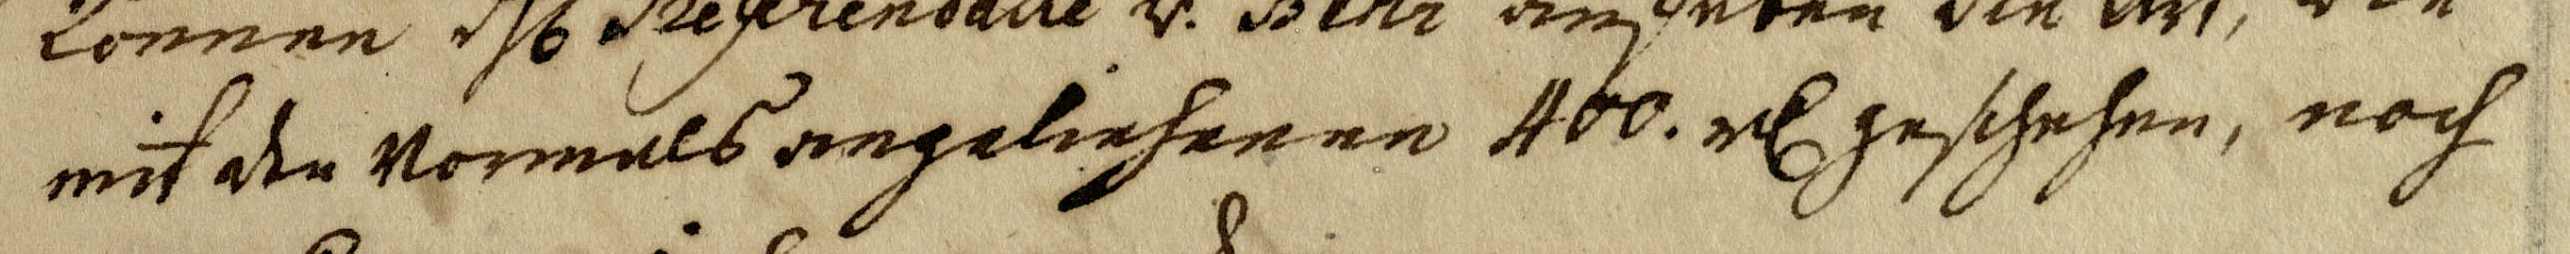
mit den vormals angeliehenen 400. rl. geschehen, noch
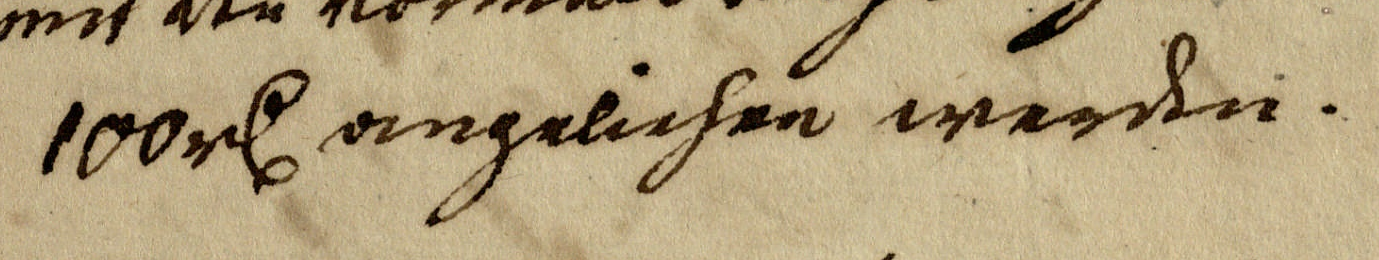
100 rl angeliehen werden.
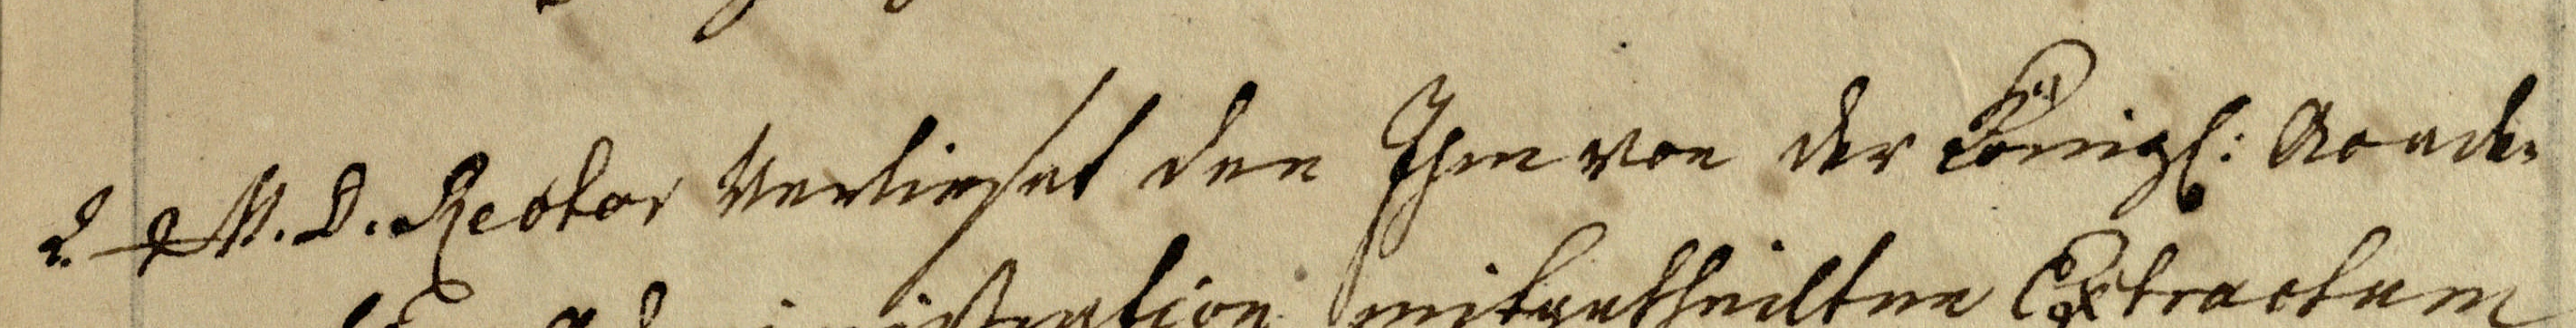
2 M. D. Rector verlieset den Ihm von der Königl. Acade¬
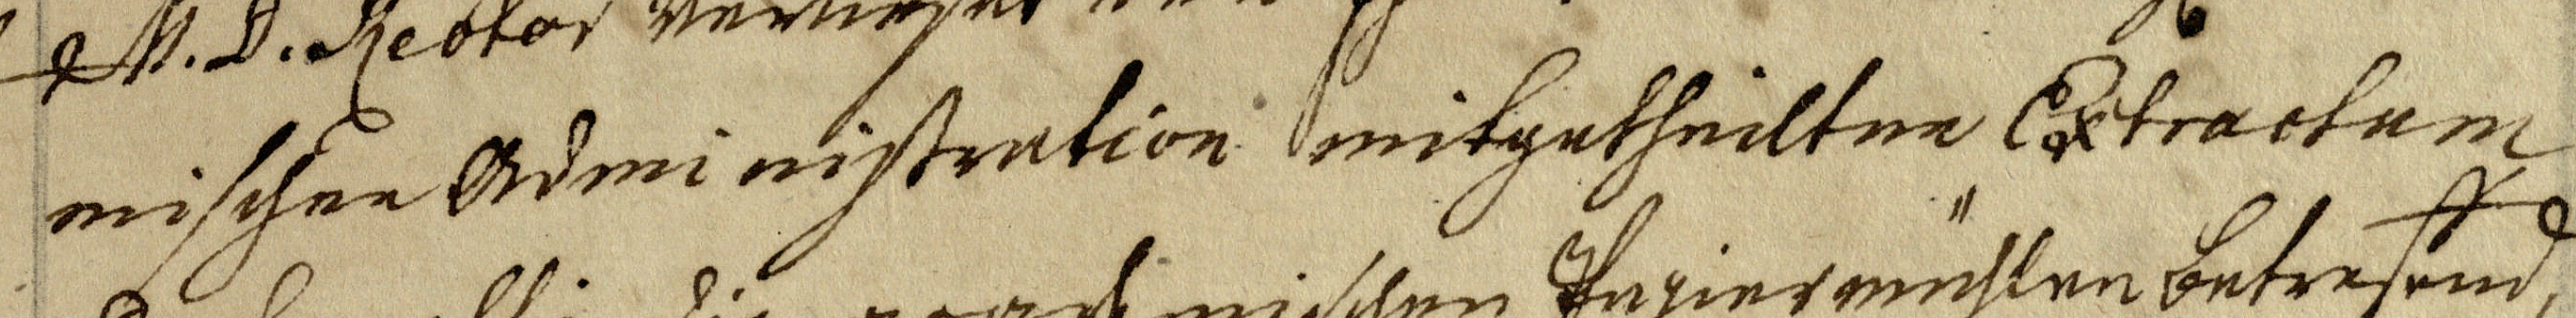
mischen Administration mitgetheilten Extractum
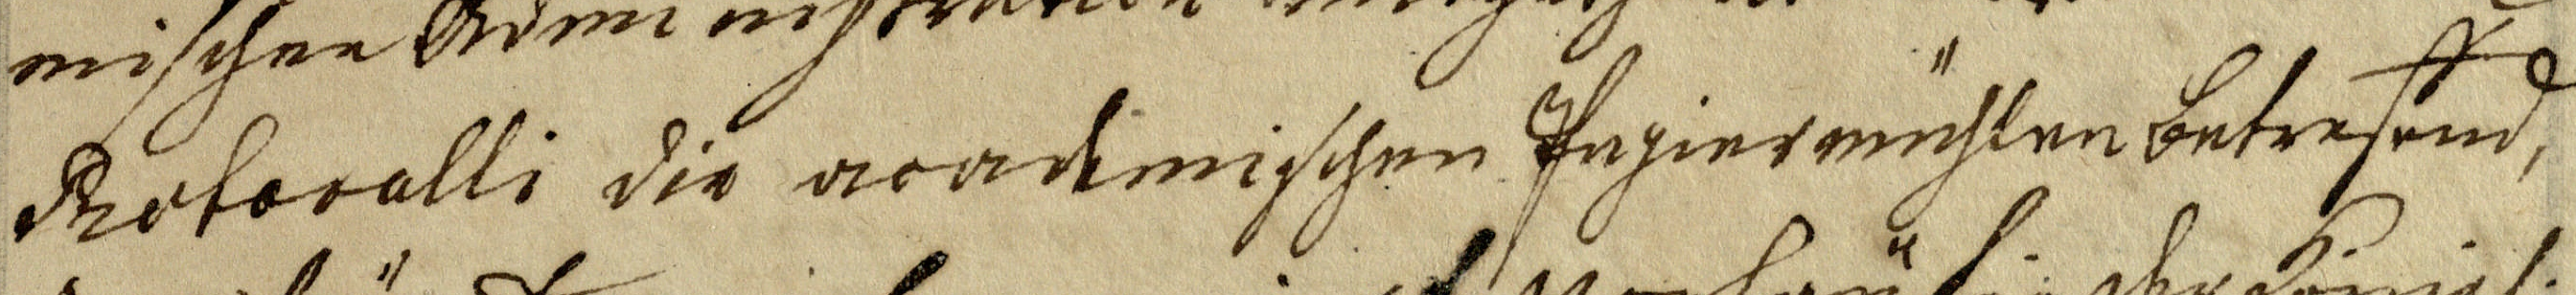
Protocolli die academischen Papiermühlen betreffend
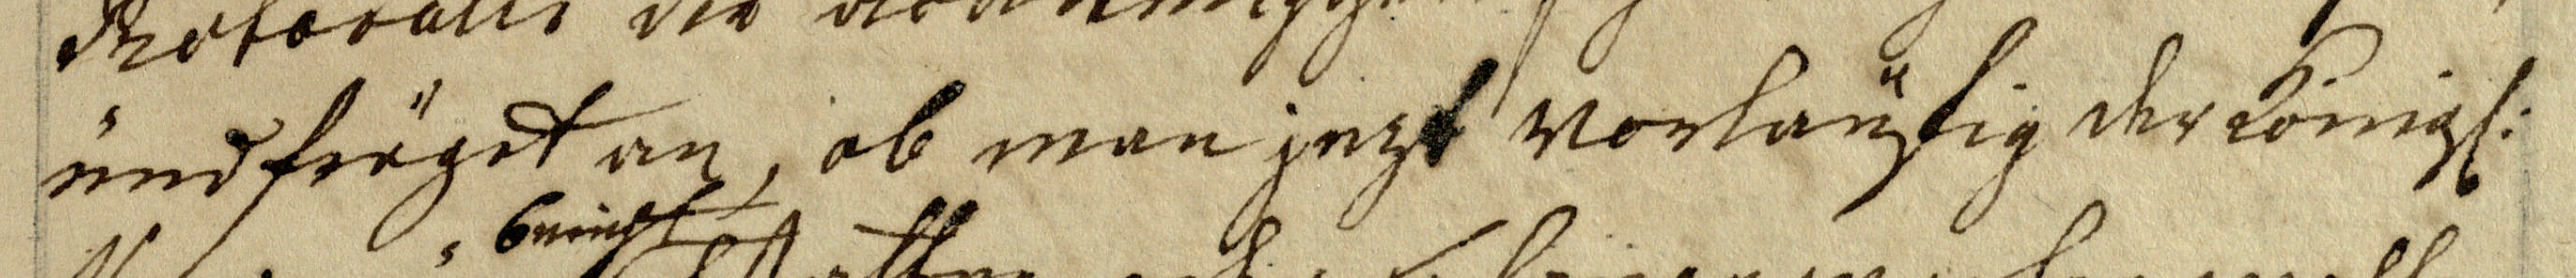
und fräget an, ob man jezt vorläufig der Königl.
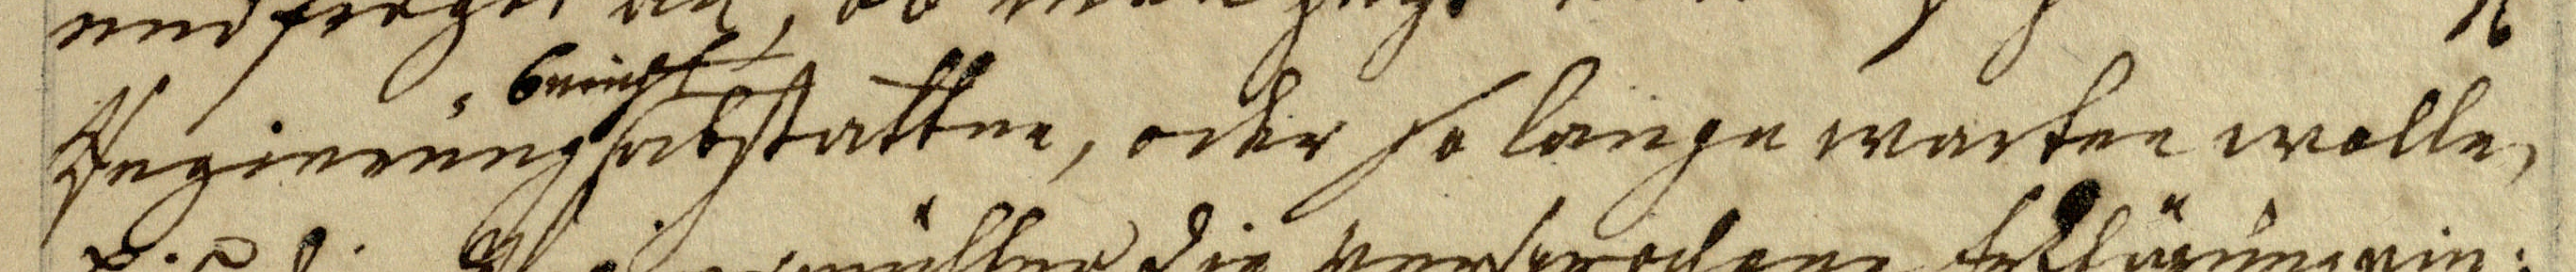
Regierung Bericht abstatten, oder so lange warten wolle,
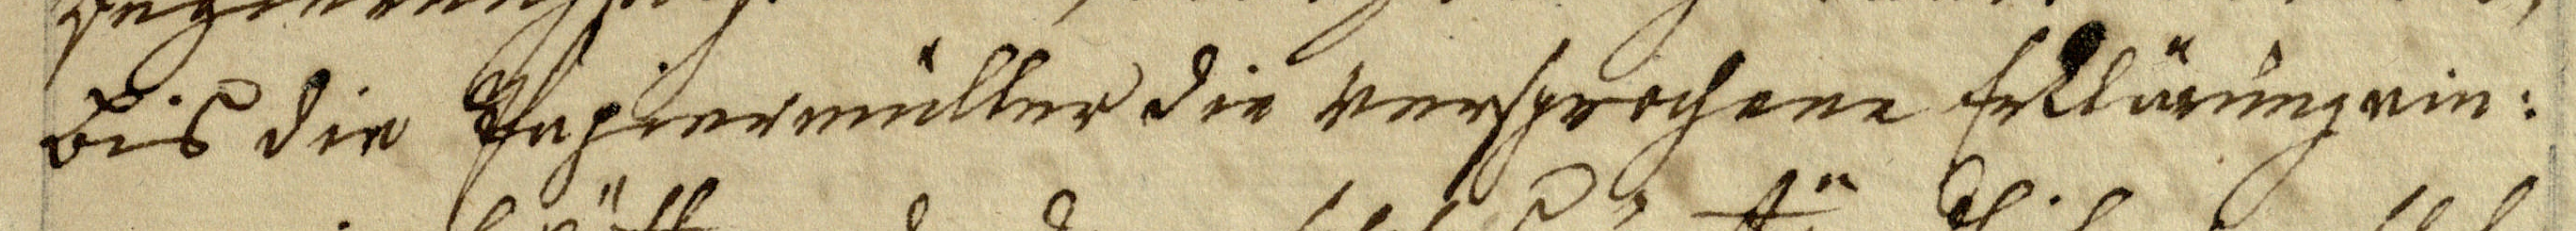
bis die Papiermüller die versprochene Erklärung ein¬
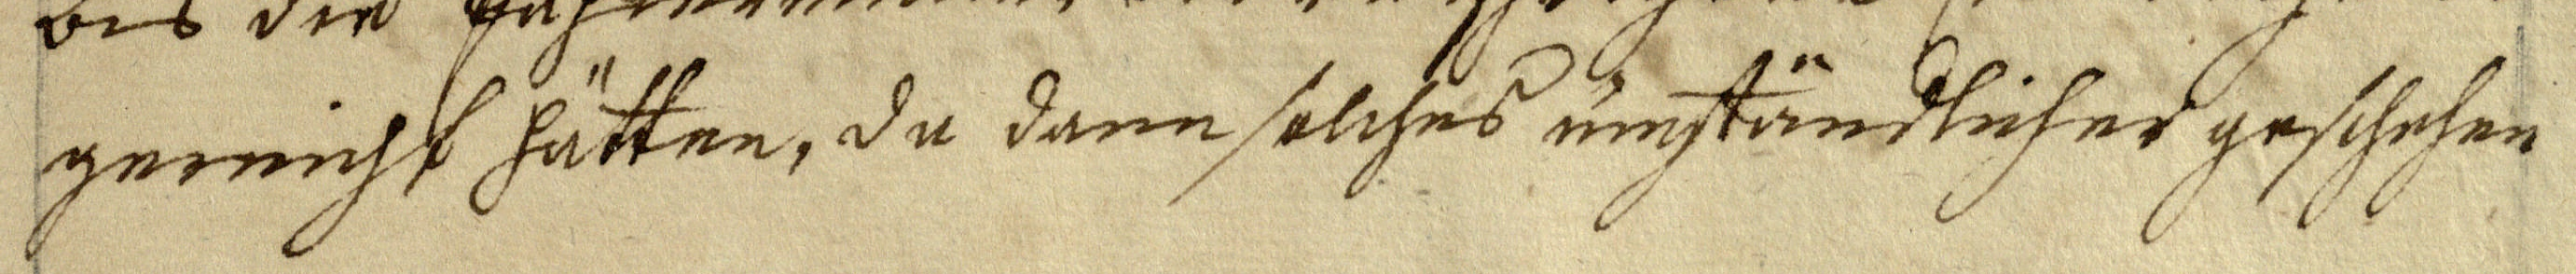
gereicht hätten, da dann solches umständlicher geschehen
